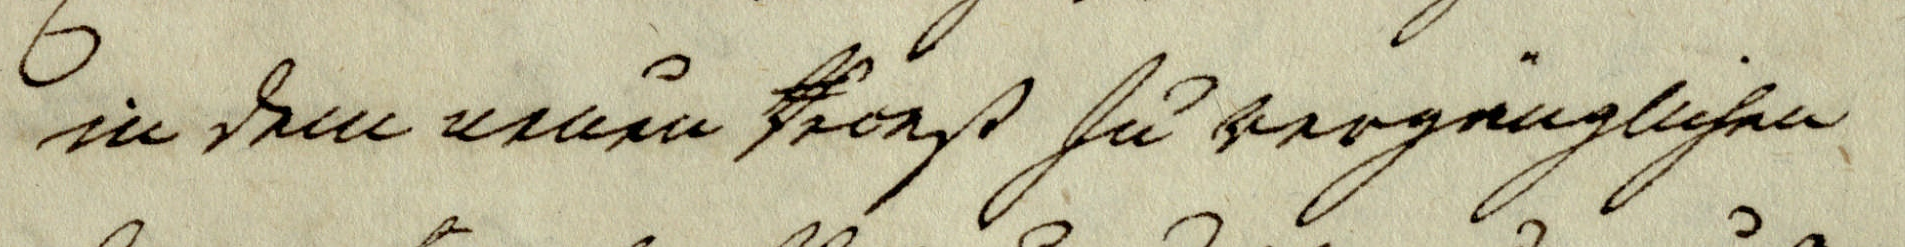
in dem neuen Receß zu vergänglichen
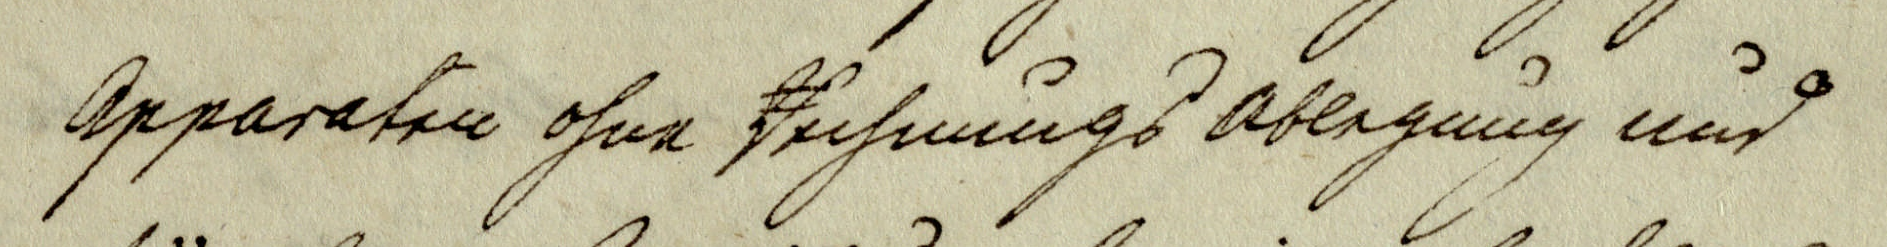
Apparaten ohne Rechnungs Ablegung und
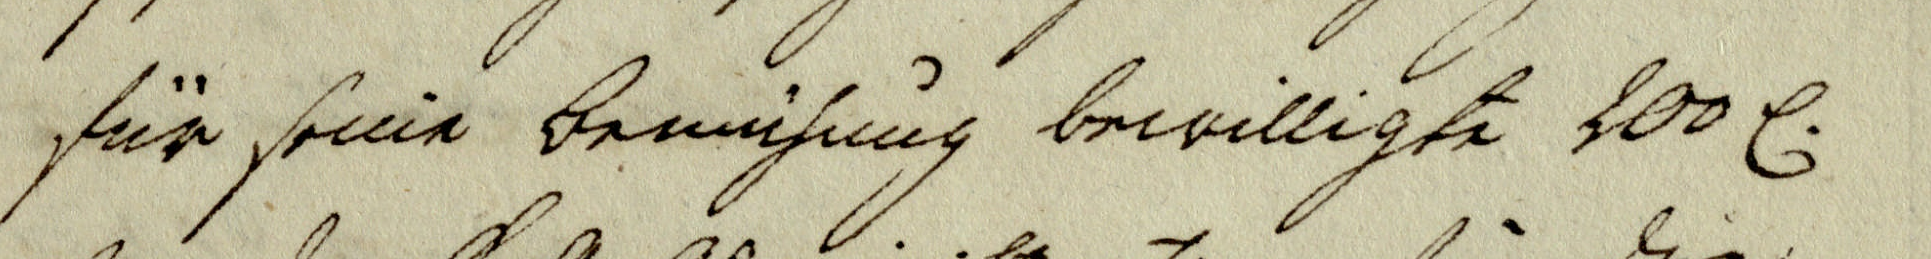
für seine Bemühung bewilligte 200 l.
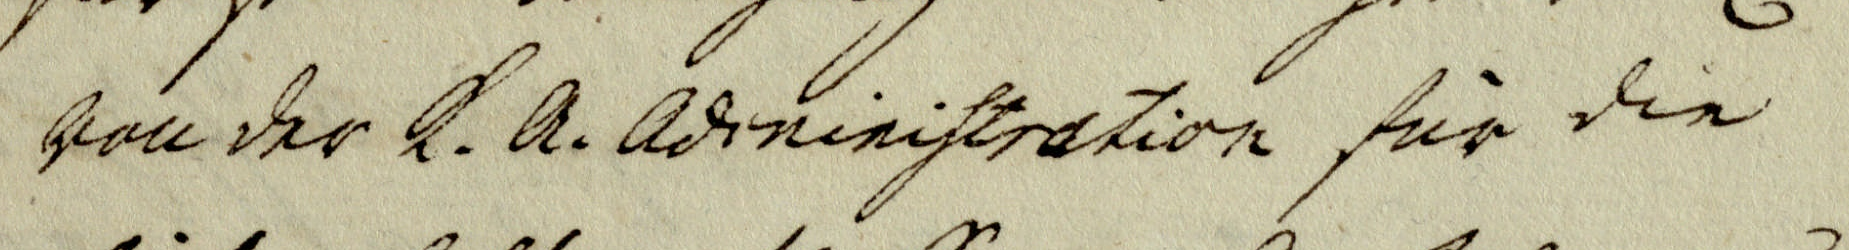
von der K. A. Administration für die
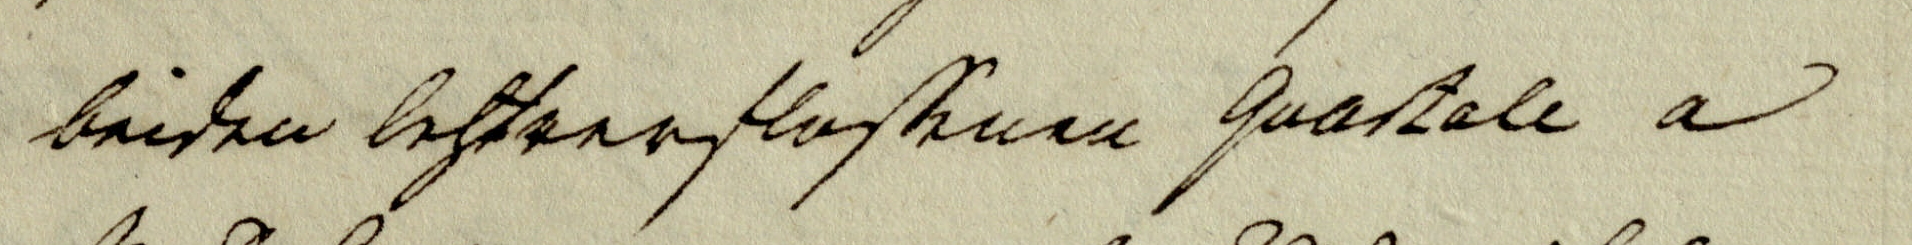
beiden letztverflossenem Quartale a
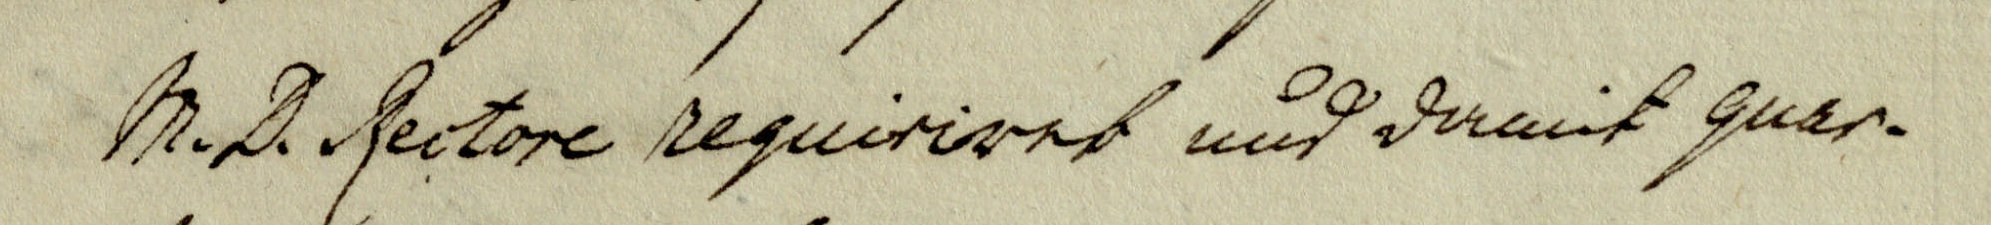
M. D. Rectore requiriret und damit quar¬
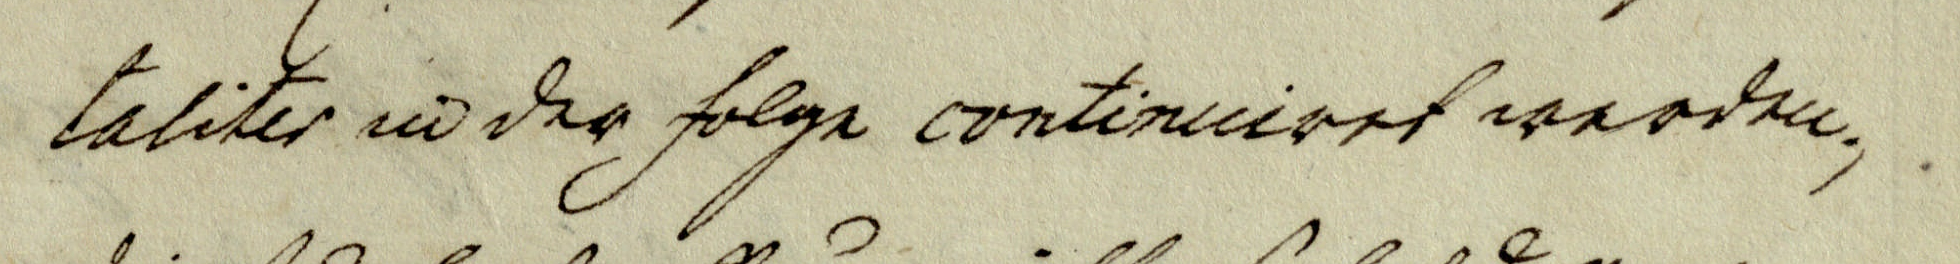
taliter in der Folge continuiret werden;
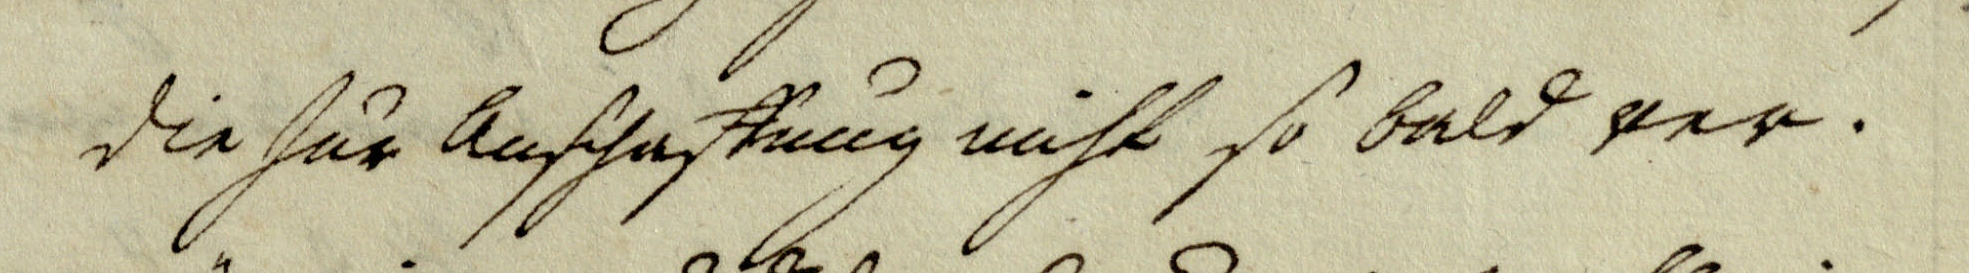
die zur Anschaffung nicht so bald ver¬
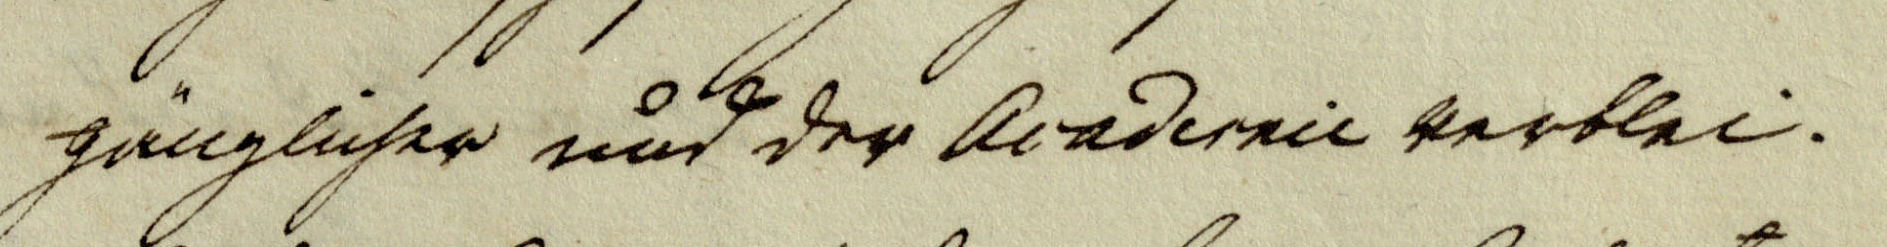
gänglicher und der Academie verblei¬
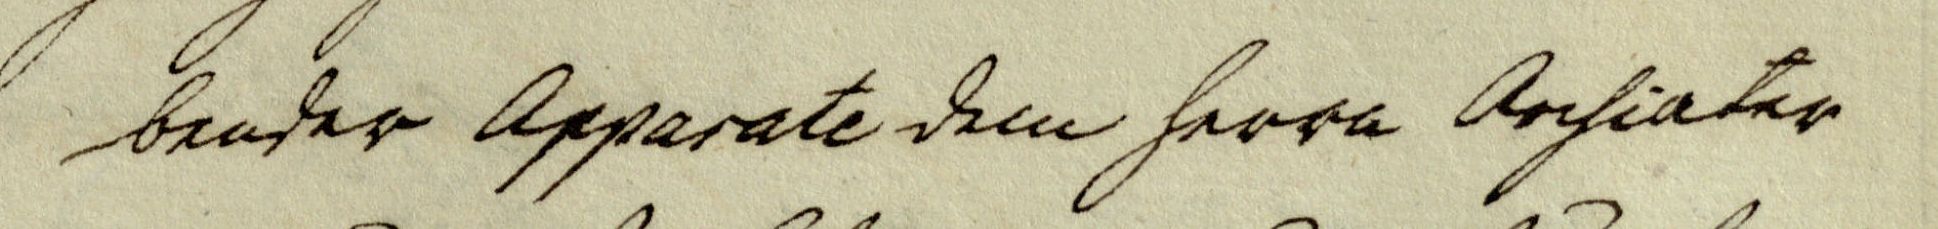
bender Apparate dem Herrn Archiater
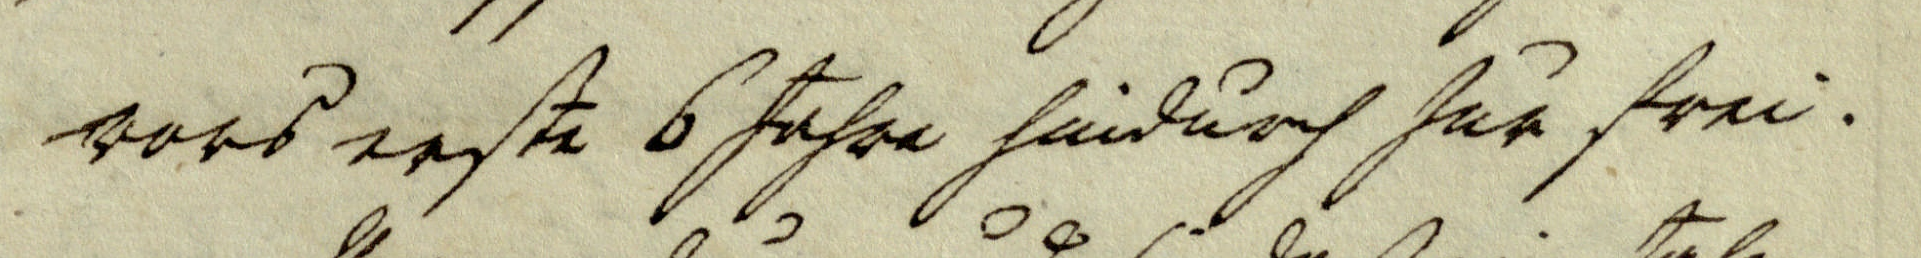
vors erste 6 Jahre hindurch zur frei¬
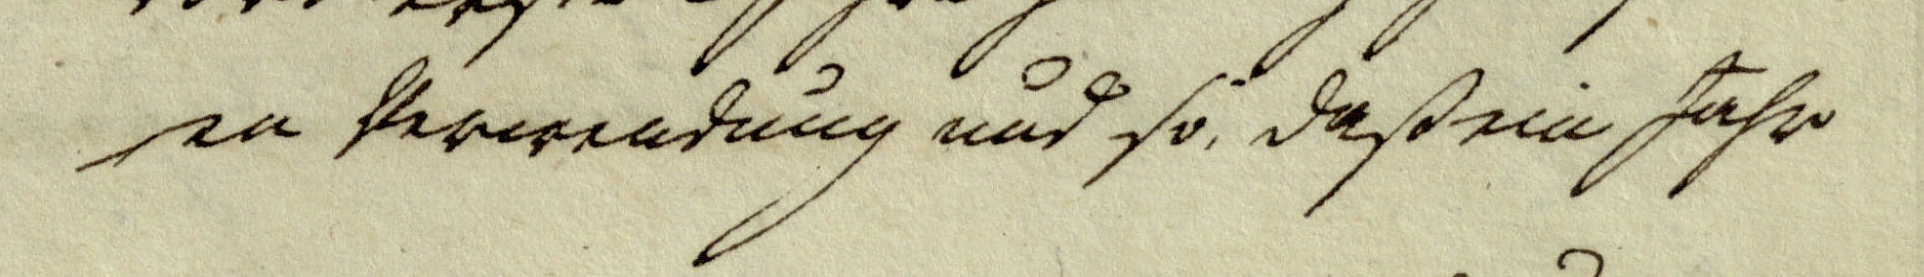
en Verwendung und so, daß ein Jahr
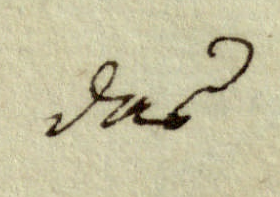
das
